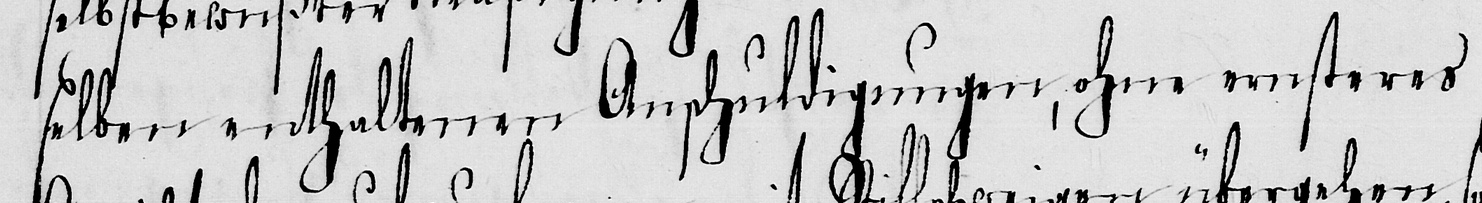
selben enthaltenen Anschuldigungen, ohne ernsteres
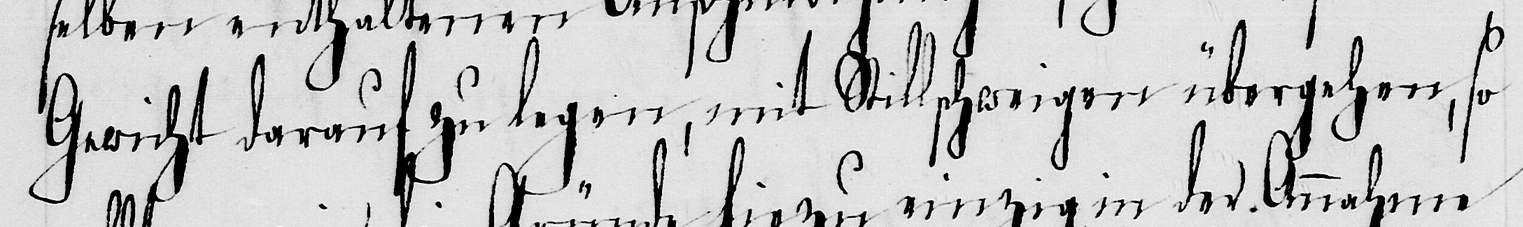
Gewicht darauf zu legen, mit Stillschweigen übergehen, so
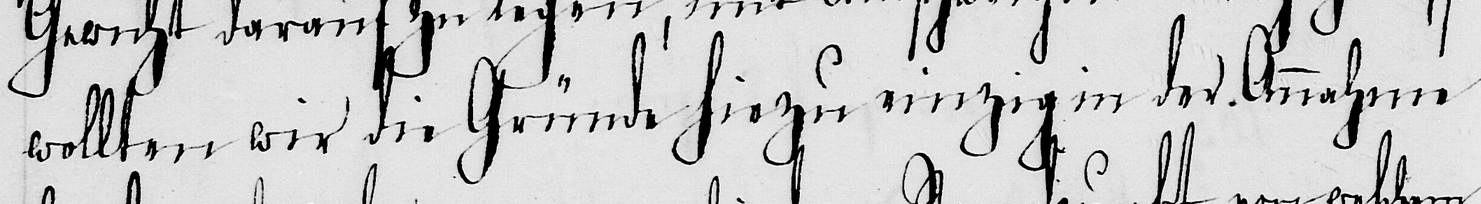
wollten wir die Gründe hiezu einzig in der Annahme
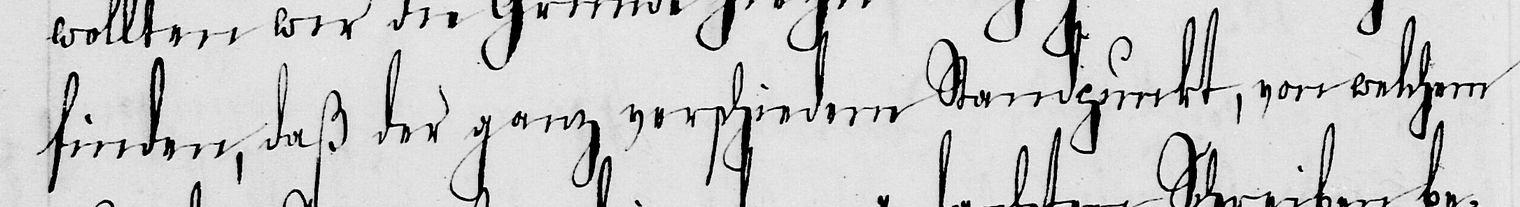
finden, daß der ganz verschiedene Standpunkt, von welchem
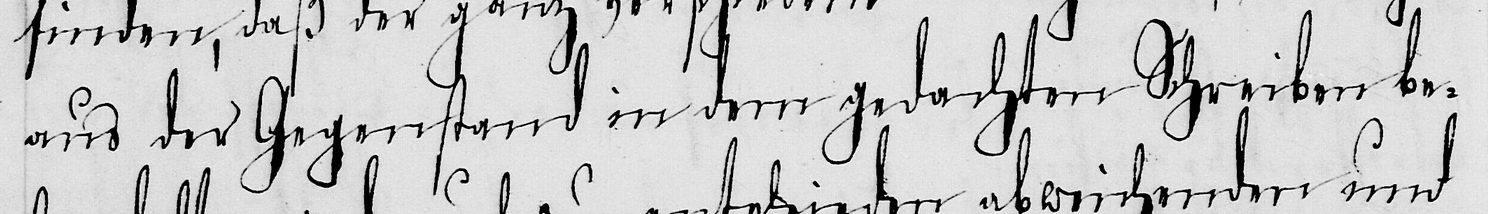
aus der Gegenstand in dem gedachten Schreiben be¬
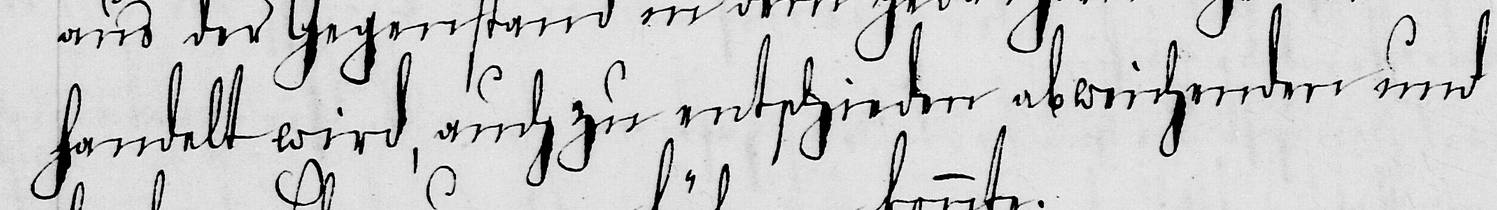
handelt wird, auch zu entschieden abweichenden und
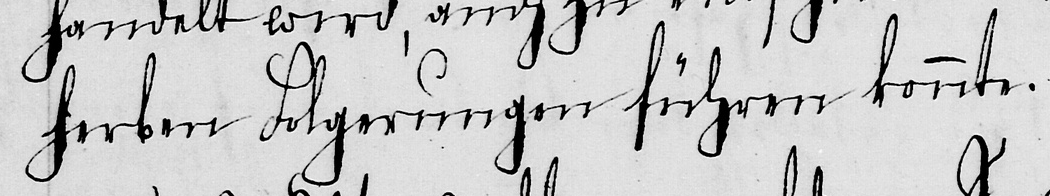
herben Folgerungen führen könnte.
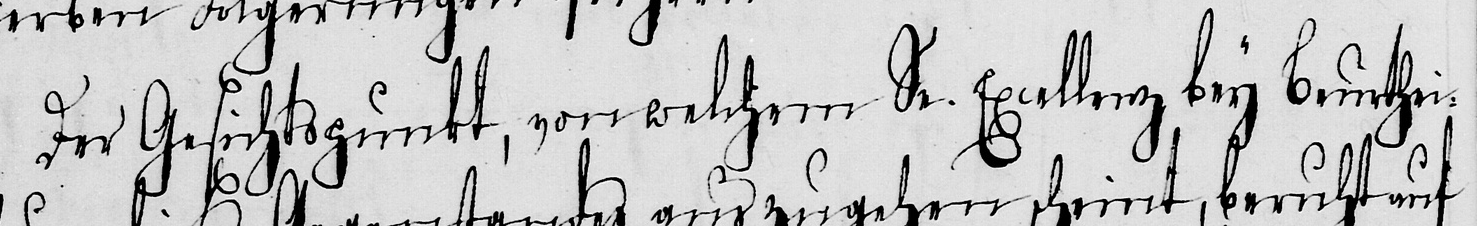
Der Gesichtspunkt, von welchem Se. Excellenz bey Beurt¬
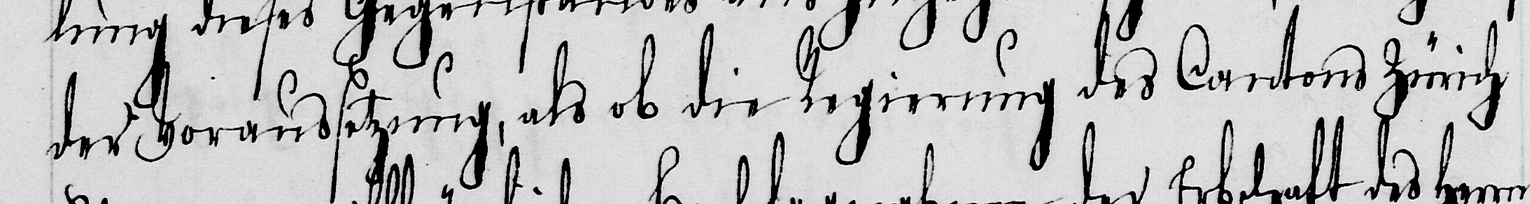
der Voraussetzung, als ob die Regierung des Cantons Zürich
